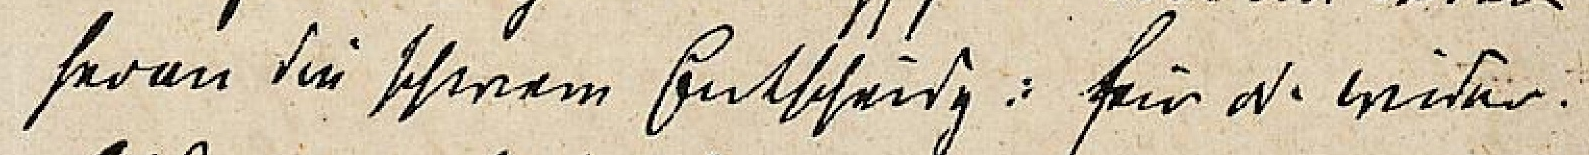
heran die schwere Entscheidg: für od. wider
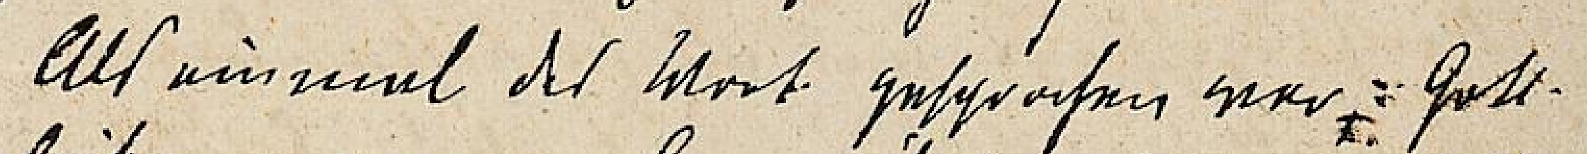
Als einmal das Wort gesprochen war: Gott
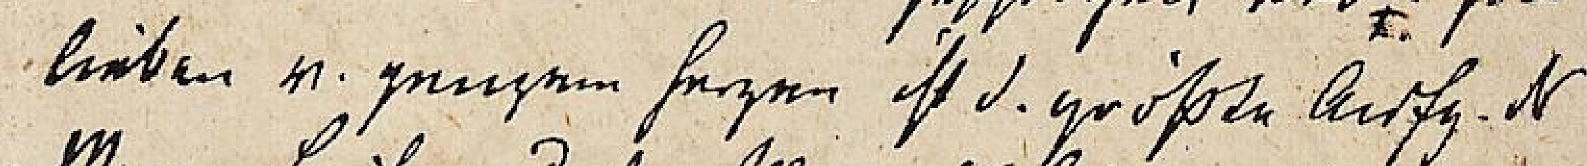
lieben v. ganzem Herzen ist d. größte Aufg. ds
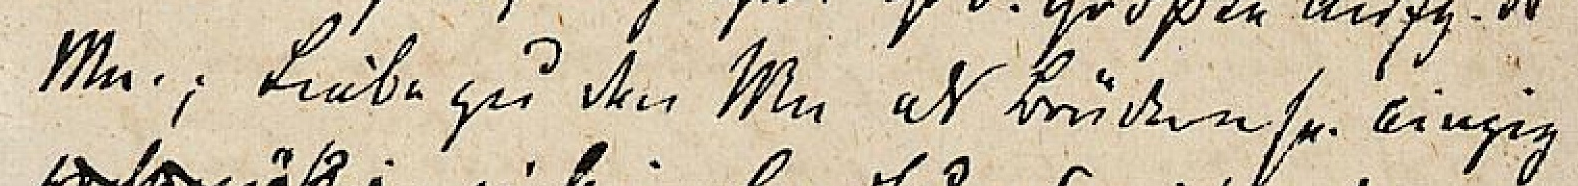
Mn., Liebe zu den Mn als Brüdern sn einzig
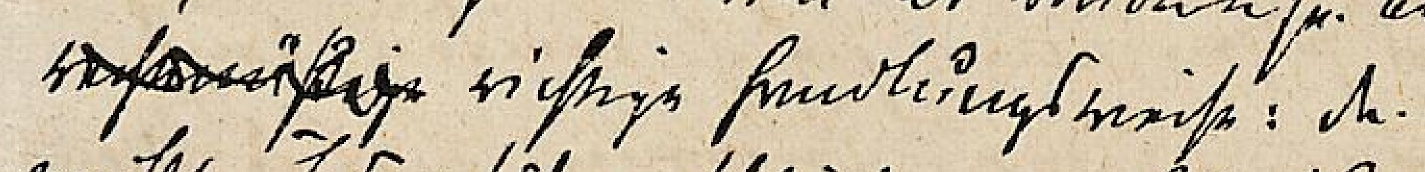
rechtmäßige richtige Handlungsweise: da
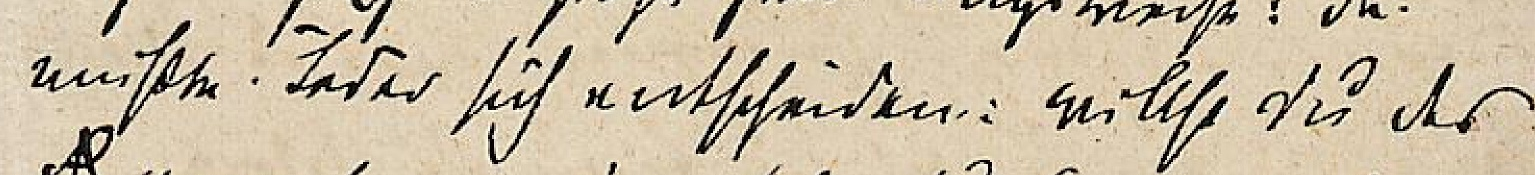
mußte Jeder sich entscheiden: willst du das
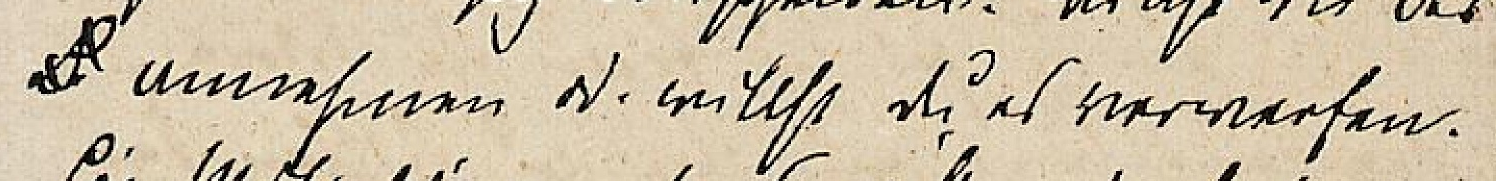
L annehmen od. willst du es verwerfen.
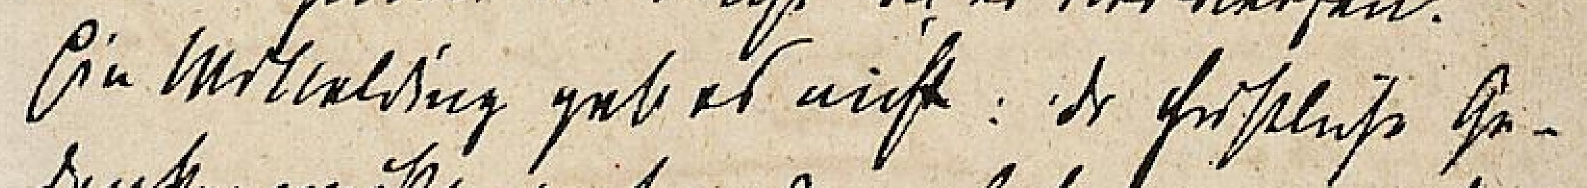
Ein Mittelding gab es nicht: dr christliche Ge¬
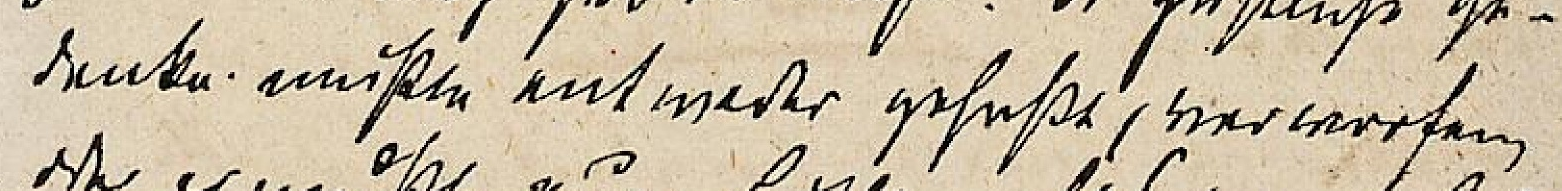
danke mußte entweder gefaßt, verworfen,
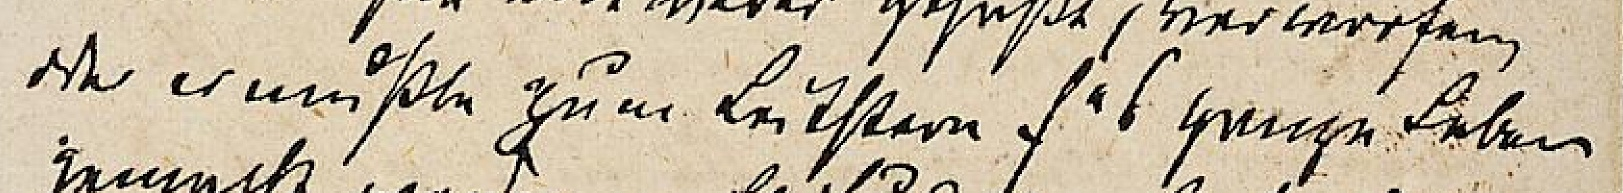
oder er mußte zum Leitstern füs ganze Leben
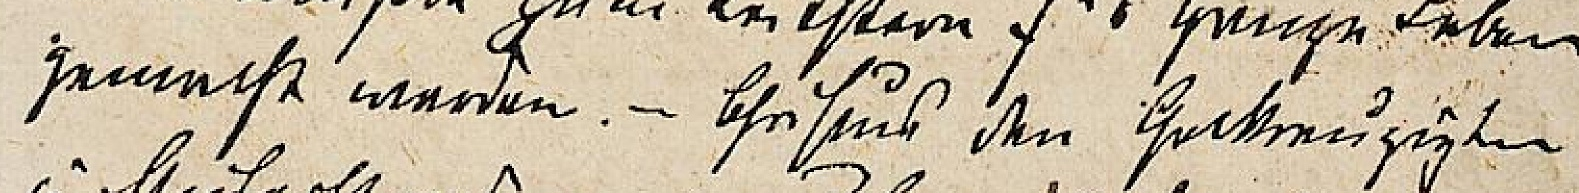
gemacht werden. - Christus den Gekreuzigten
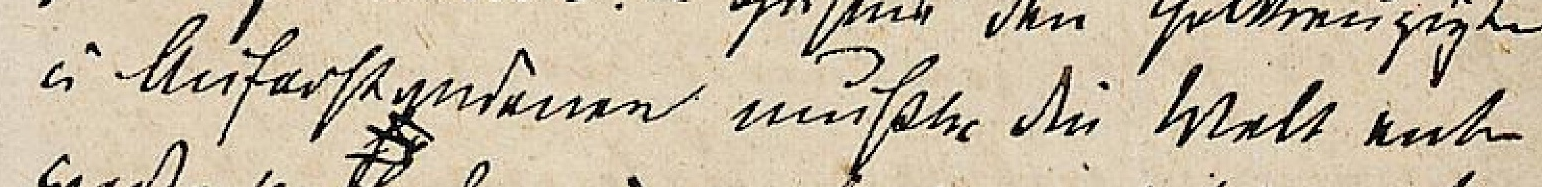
u. Auferstandenen mußte die Welt ent¬
